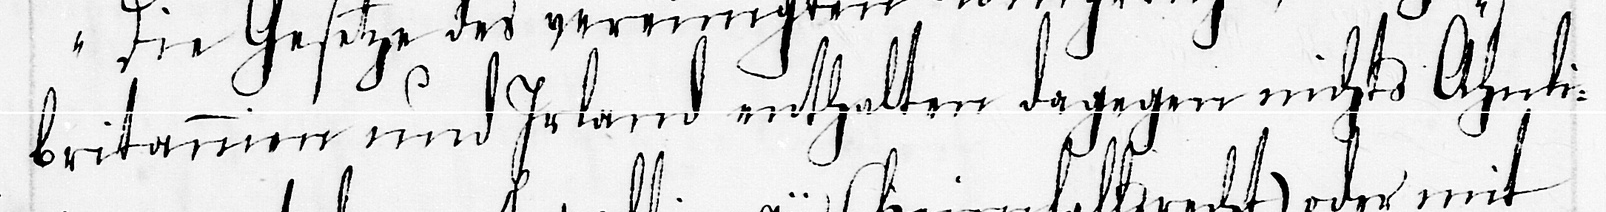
britannien und Irland enthalten dagegen nichts Ähnli¬
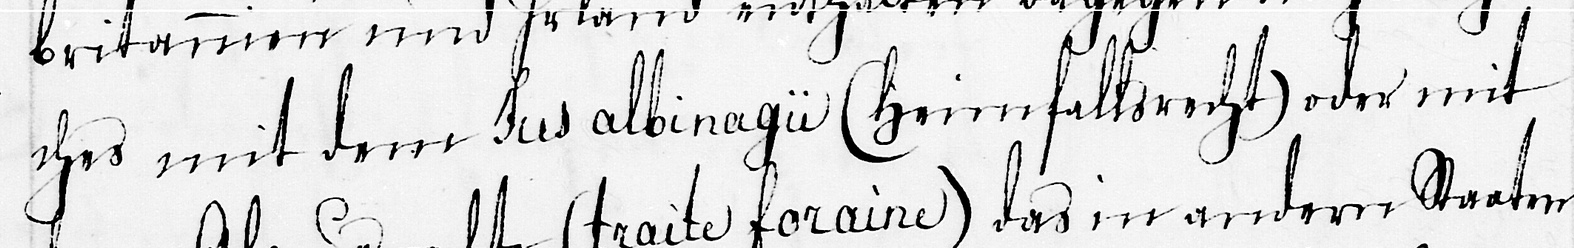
ches mit dem Jus albinagii (Heimfallsrecht) oder mit
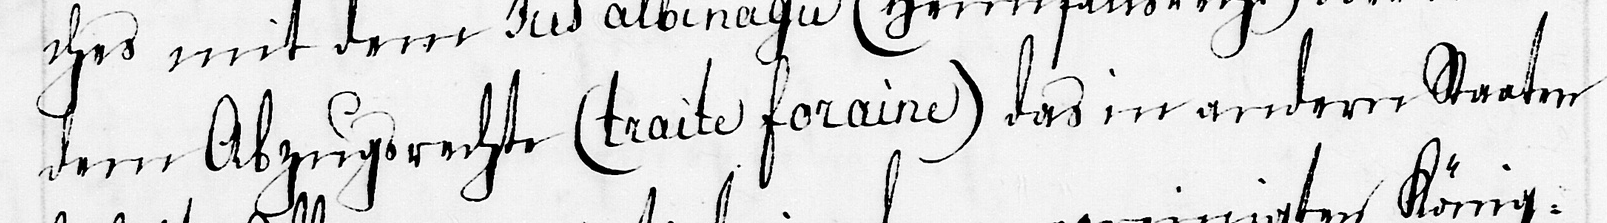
dem Abzugsrechte (traite foraine) das in andern Staaten
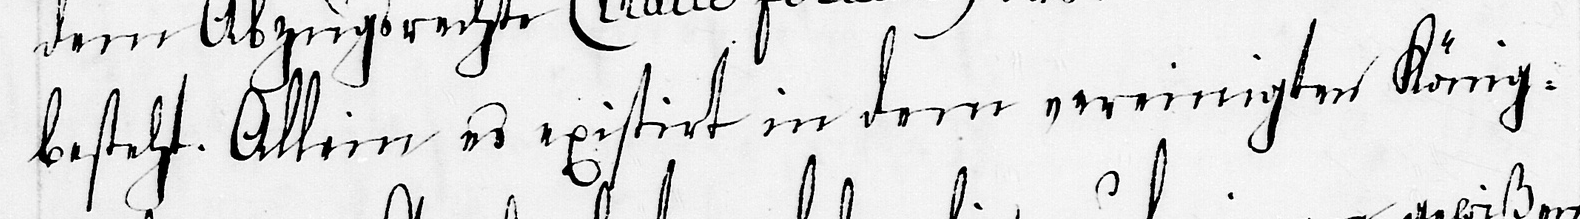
besteht. Allein es existirt in dem vereinigten König¬
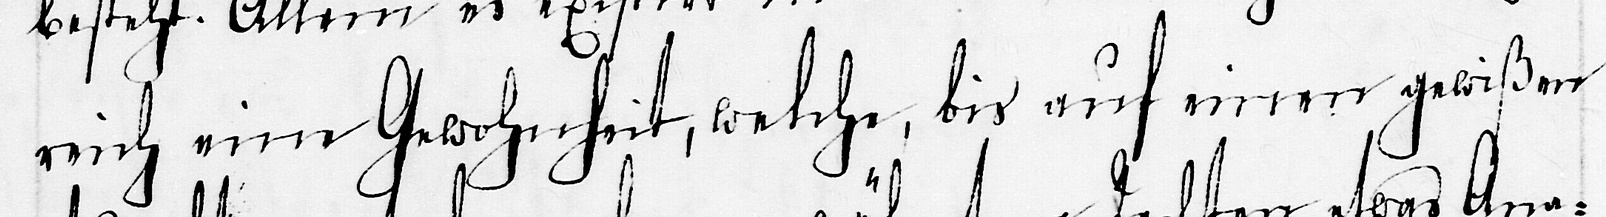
reich eine Gewohnheit, welche, bis auf einen gewißen
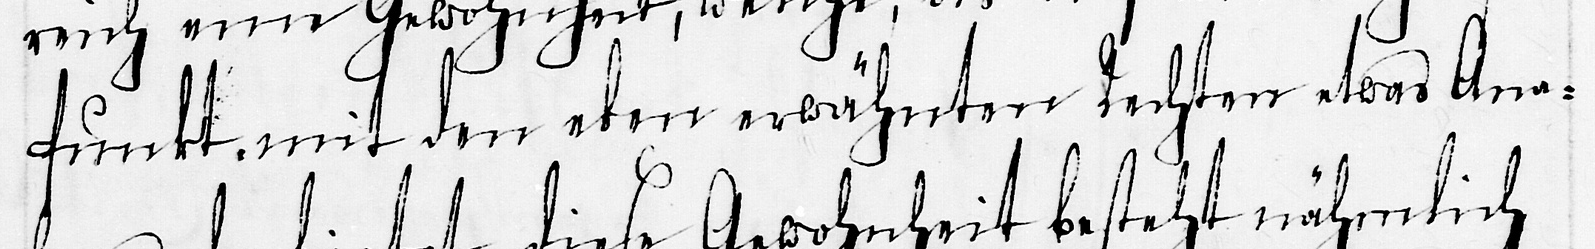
Punkt mit den eben erwähnten Rechten etwas Ana¬
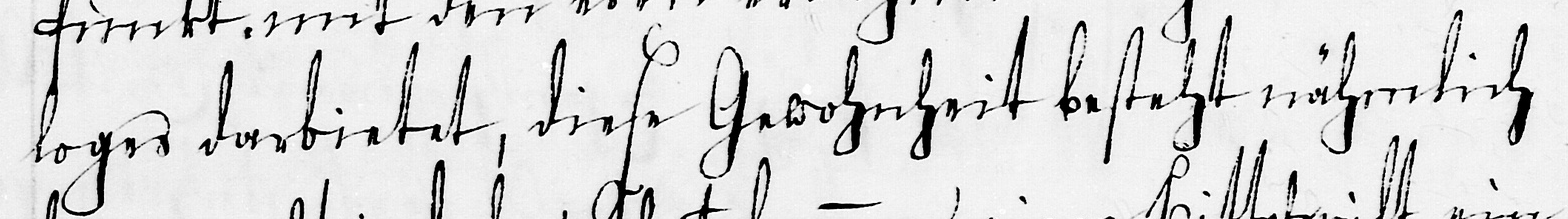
loges darbietet, diese Gewohnheit besteht nähmlich
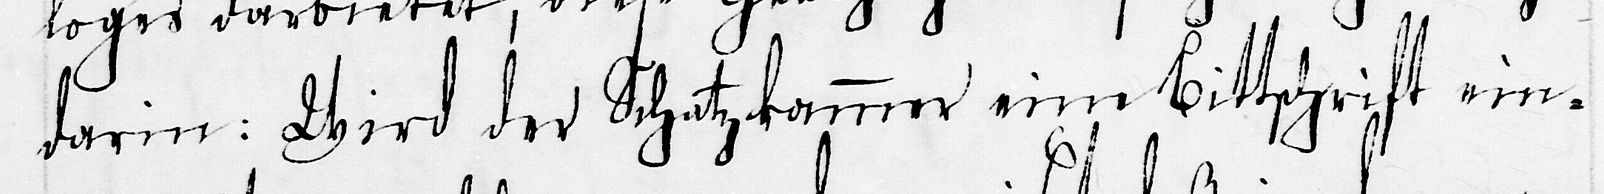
darin: Wird der Schatzkammer eine Bittschrift ein¬
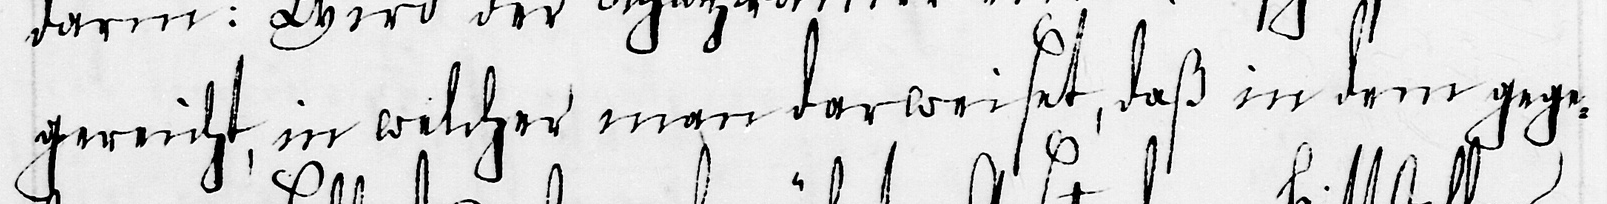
gereicht, in welcher man darweiset, daß in dem gege¬
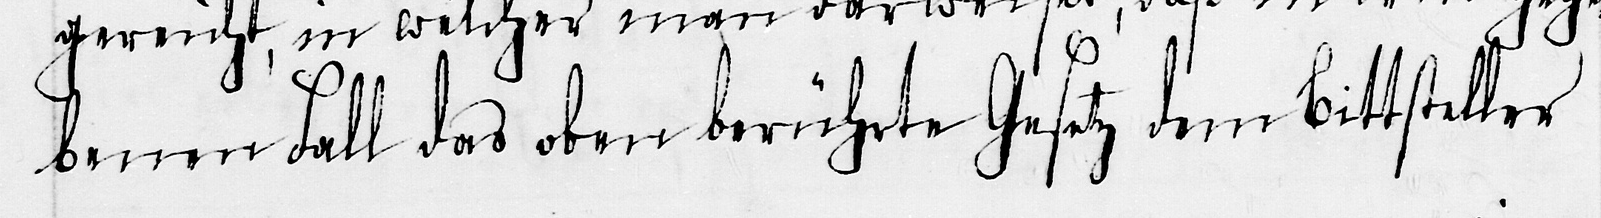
benen Fall das oben berührte Gesetz dem Bittsteller
